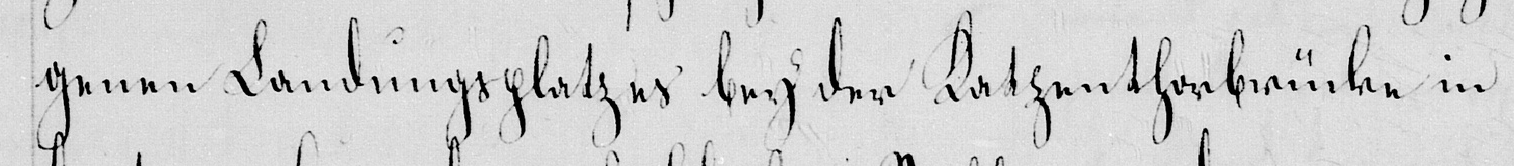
genen Landungsplatzes bey der Katzenthorbrücke in
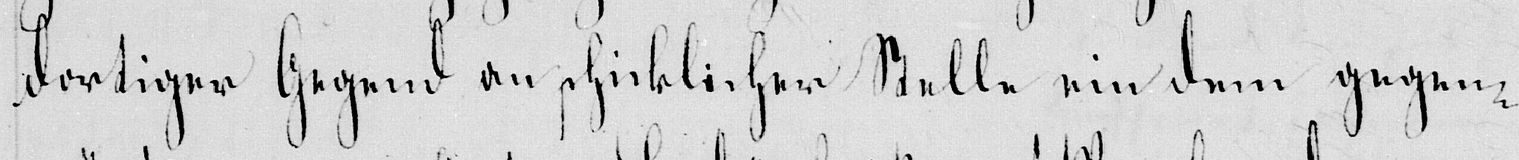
dortiger Gegend an schicklicher Stelle ein dem gegen¬
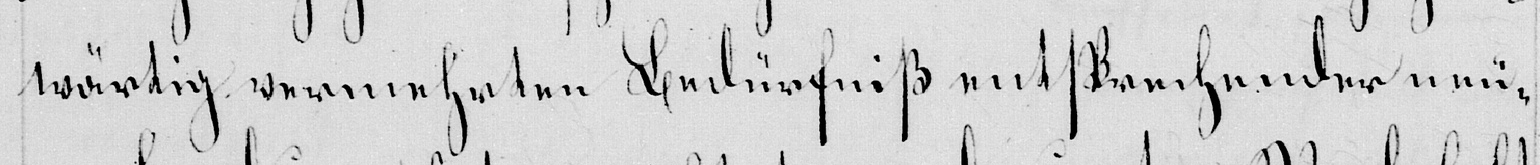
wärtig vermehrten Bedürfniß entsprechender neu¬
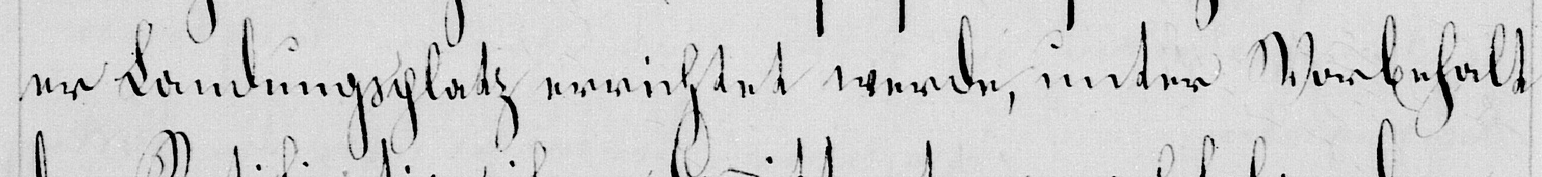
er Landungsplatz errichtet werde, unter Vorbehalt
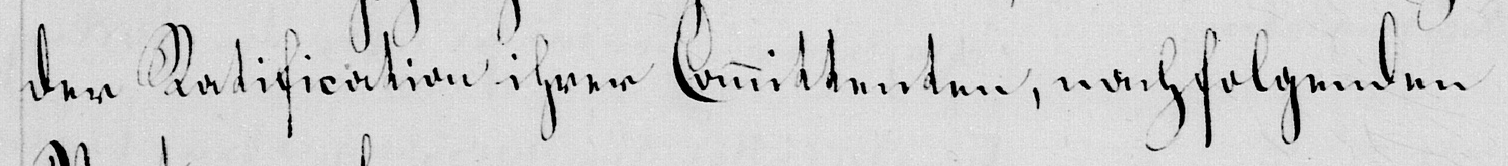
der Ratification ihrer Commitenten, nachfolgenden
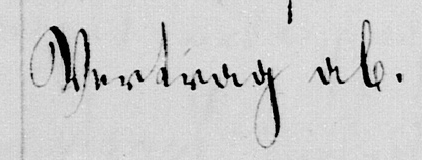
Vertrag ab.
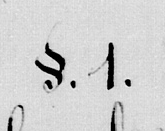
§. 1.
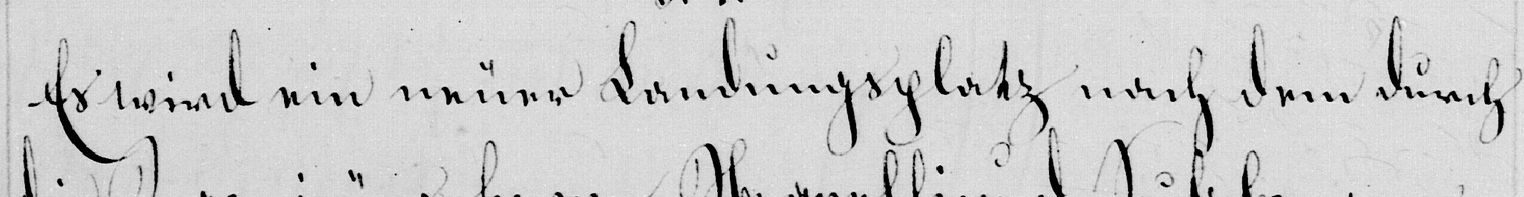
Es wird ein neuer Landungsplatz nach dem durch
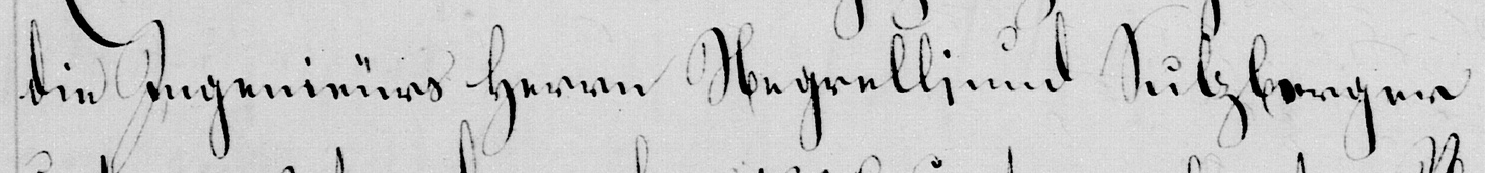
die Ingenieurs Herren Negrelli und Sulzberger
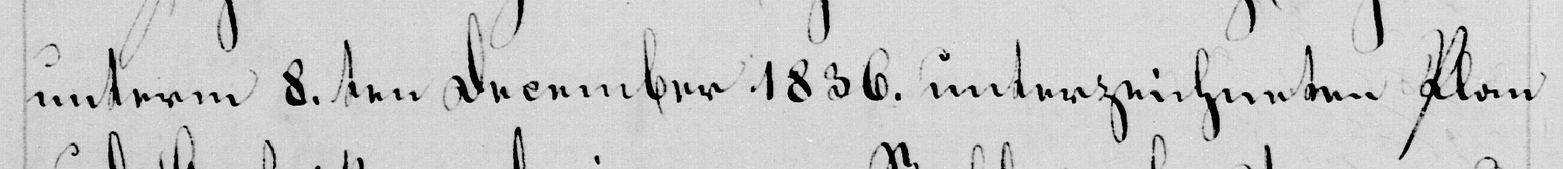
unterm 8.ten December 1836. unterzeichneten Plan
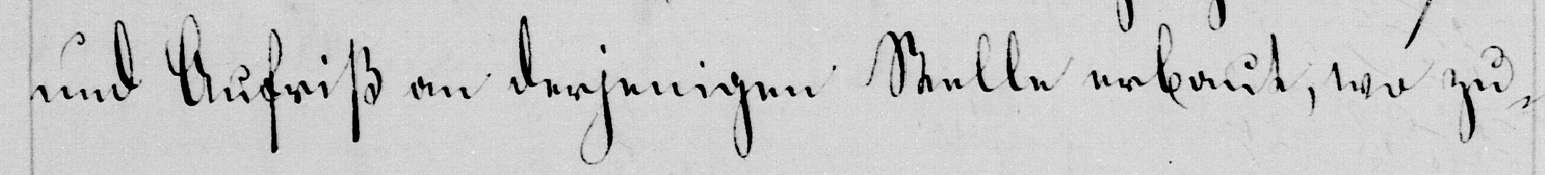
und Aufriß an derjenigen Stelle erbaut, wo zu-
